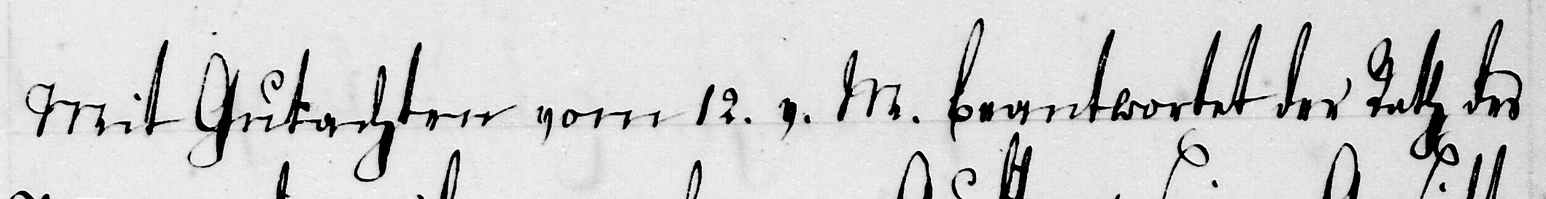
Mit Gutachten vm 12.v. M. beantwortet der Rath des
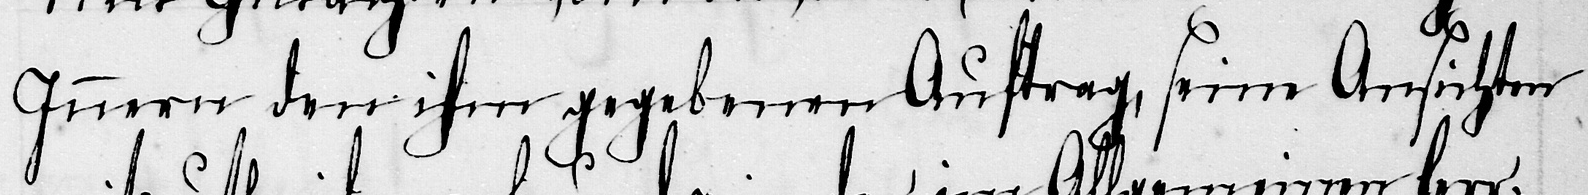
Innern den ihm gegebenen Auftrag, seine Ansichten
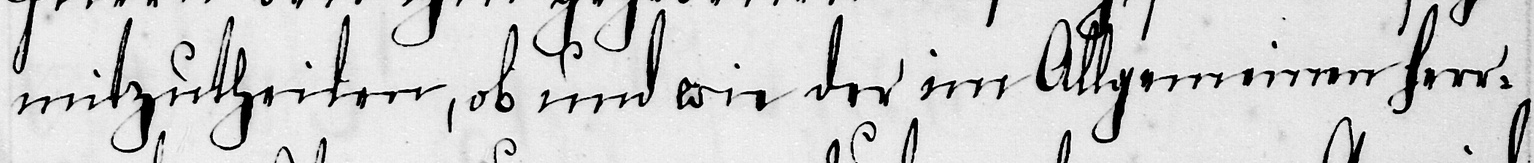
mitzutheilen, ob und wie der im Allgemeinen herr¬
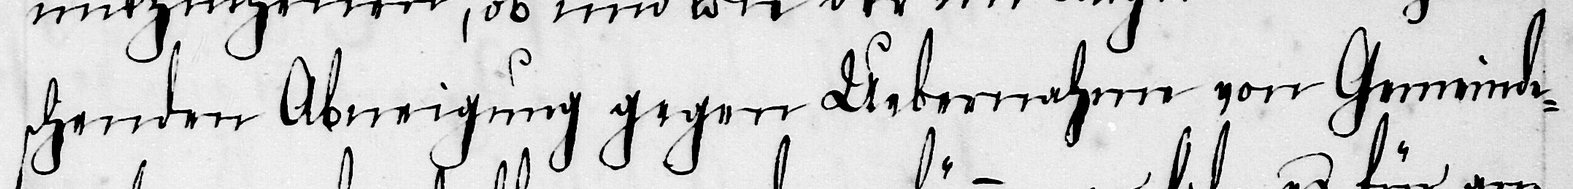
schenden Abneigung gegen Uebernahme von Gemeinde¬
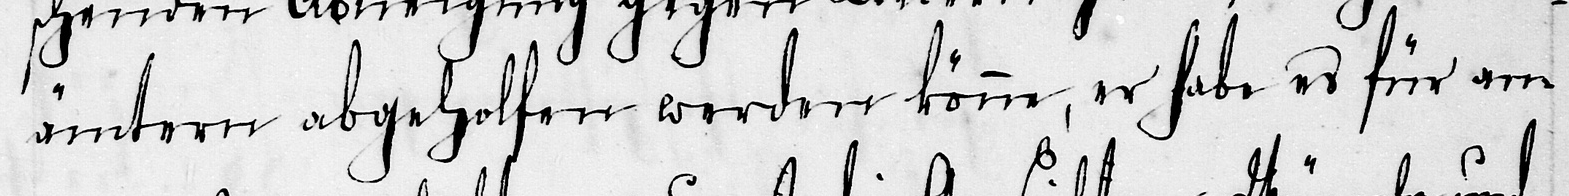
ämtern abgeholfen werde könne, er habe es für an¬
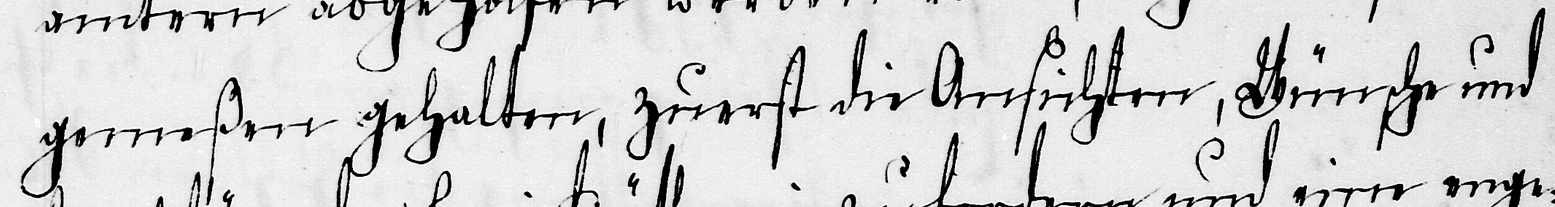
gemeßen gehalten, zuerst die Ansichten, Wünsche und
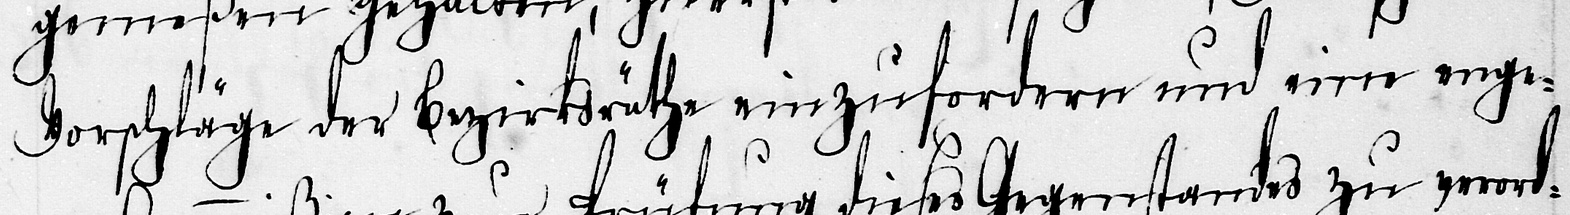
Vorschläge der Bezirksräthe einzufordern und eine enge¬
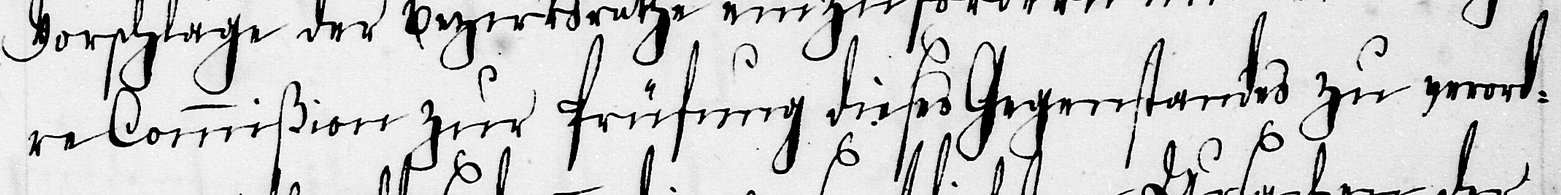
re Commißion zur Prüfung dieses Gegenstandes zu verord¬
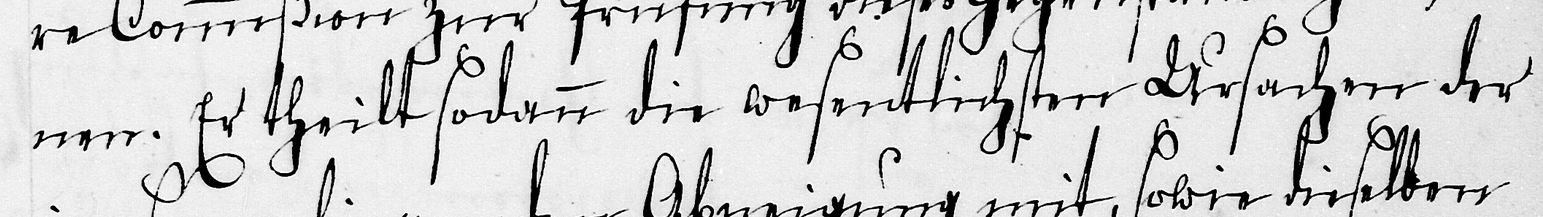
nen. Er theilt sodann die wesentlichsten Ursachen der
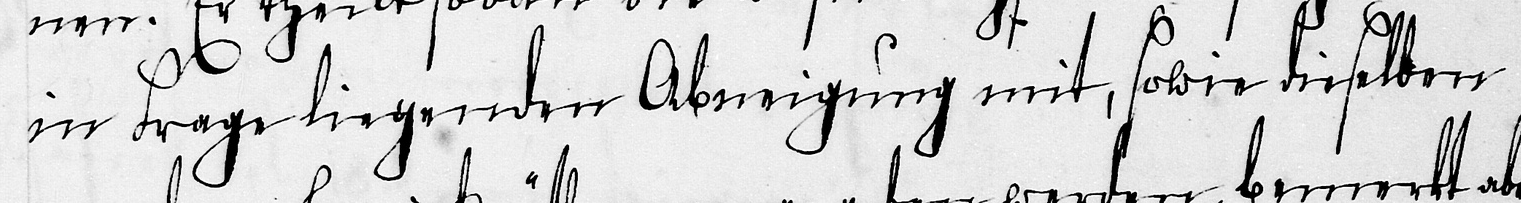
in Frage liegenden Abneigung mit, sowie dieselben
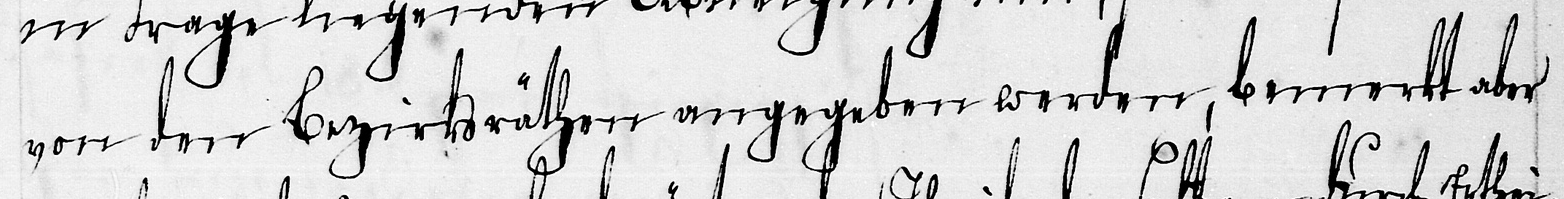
von den Bezirksräthen angegeben werden, bemerkt aber
